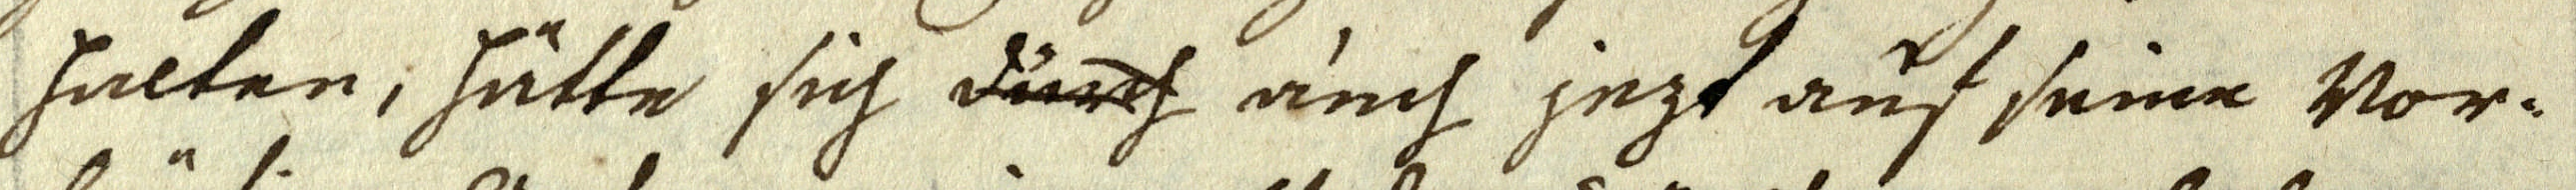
halten, hätte sich durch auch jezt auf seine vor¬
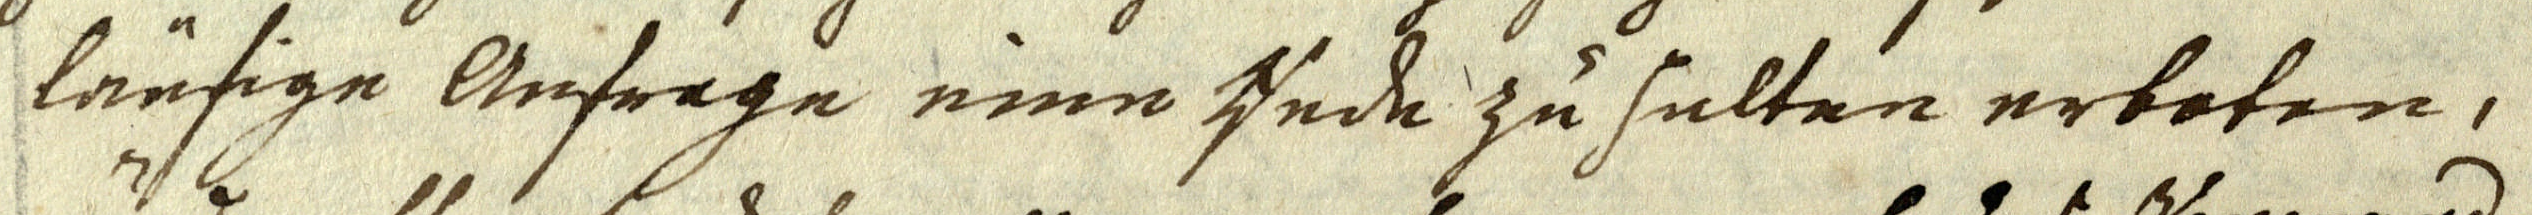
läufige Anfrage eine Rede zu halten erboten,
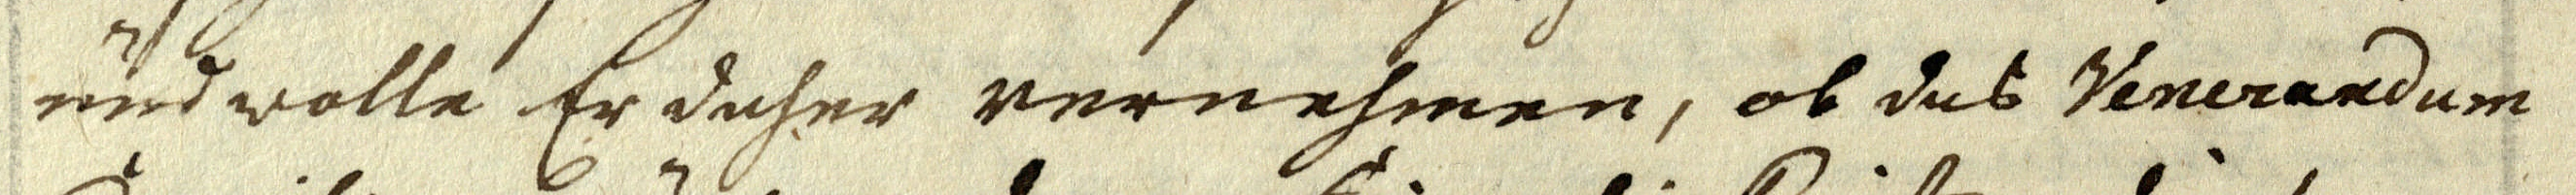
und wolle Er daher vernehmen, ob das Venerandum
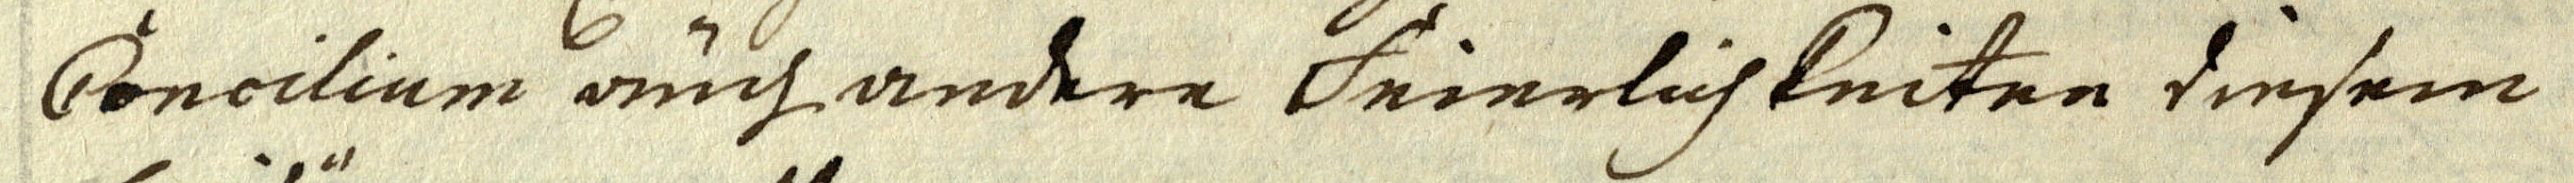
Concilium auch andere Feierlichkeiten diesem
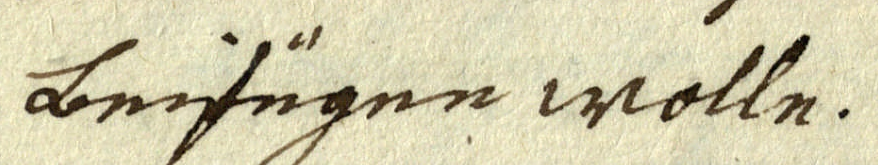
beifügen wolle.
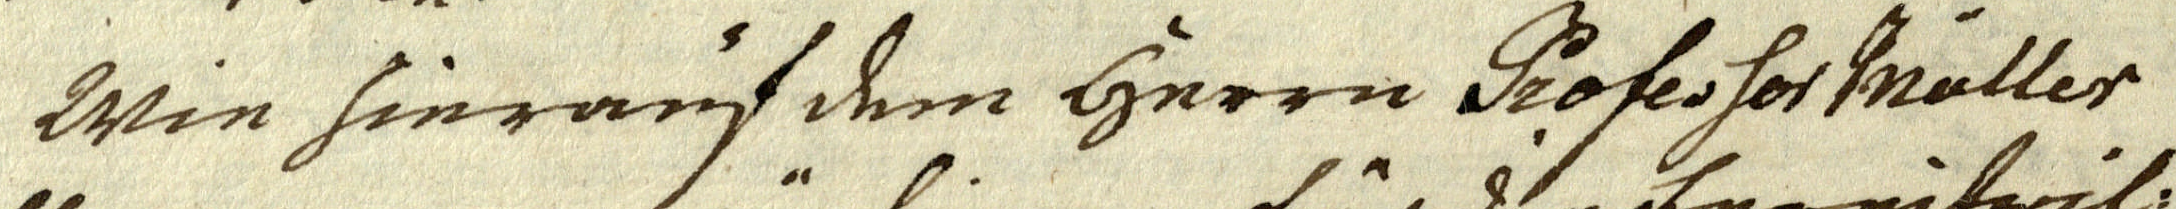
Wie hierauf dem Herrn Professor Möller
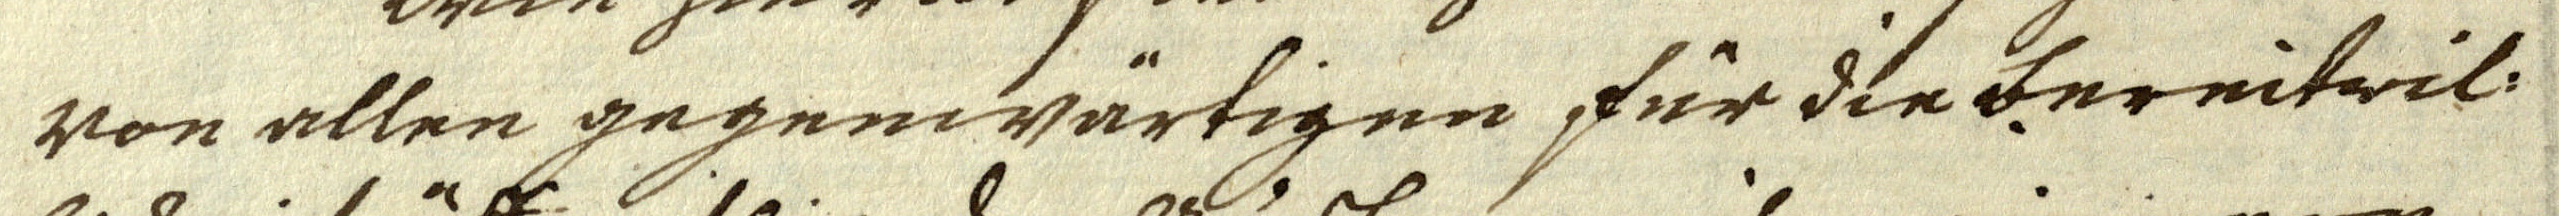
von allen gegenwärtigen für die Bereitwil¬
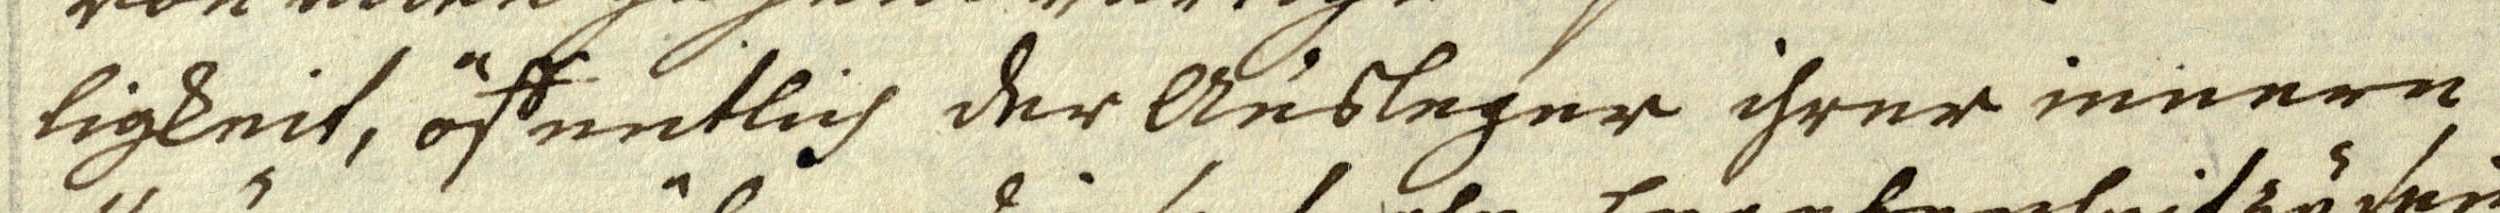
ligkeit, öffentlich der Ausleger ihrer innern
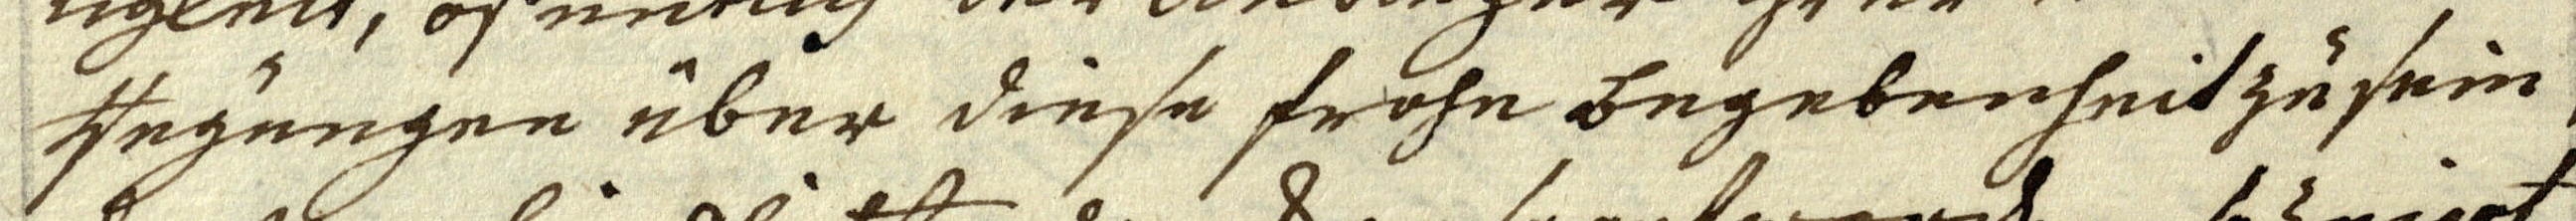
Regungen über diese frohe Begebenheit zu sein,
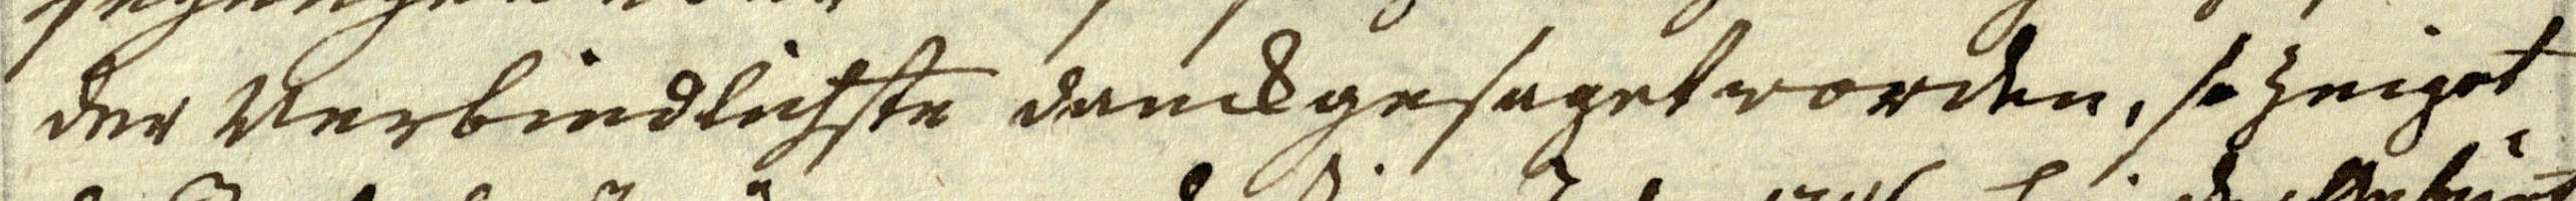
der verbindlichste Danck gesagt worden, so zeiget
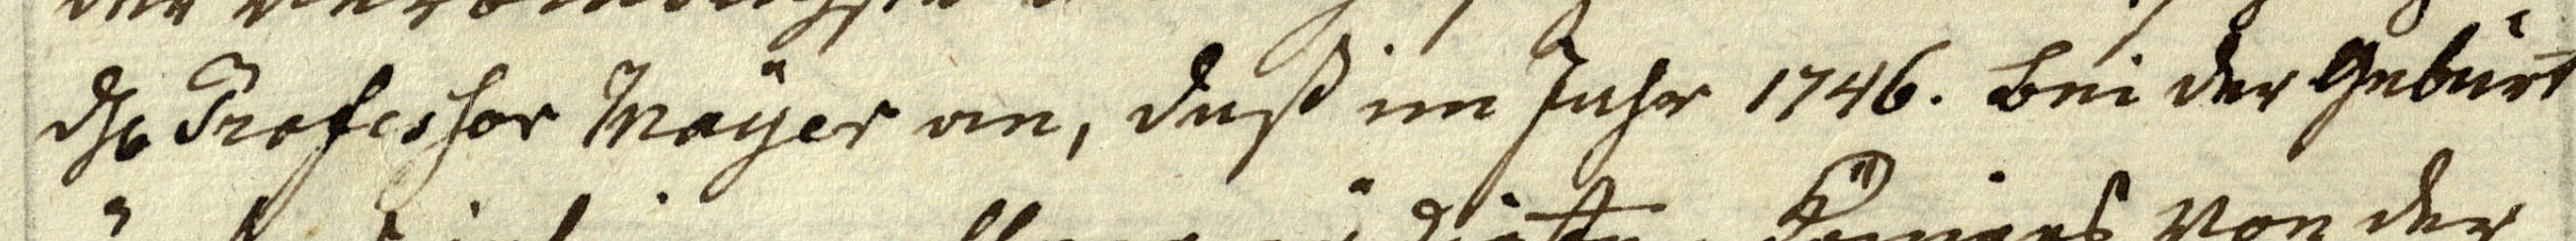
dh. Professor Maÿer an, daß im Jahr 1746. bei der Geburt
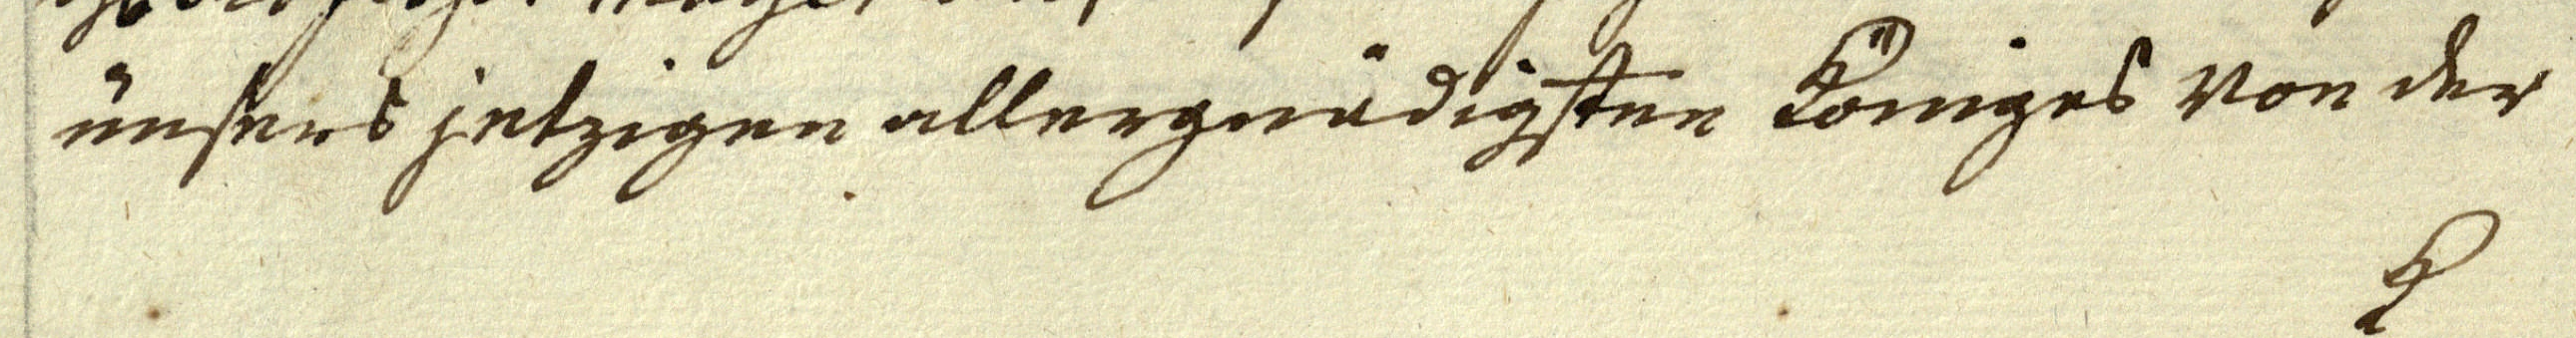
unseres jetzigen allergnädigsten Königes von der
